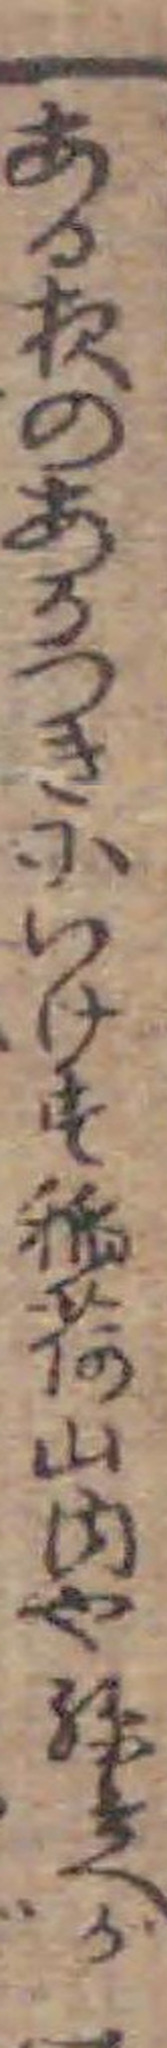ある夜のあるつきにいけす稲荷山内や孫兵衛が
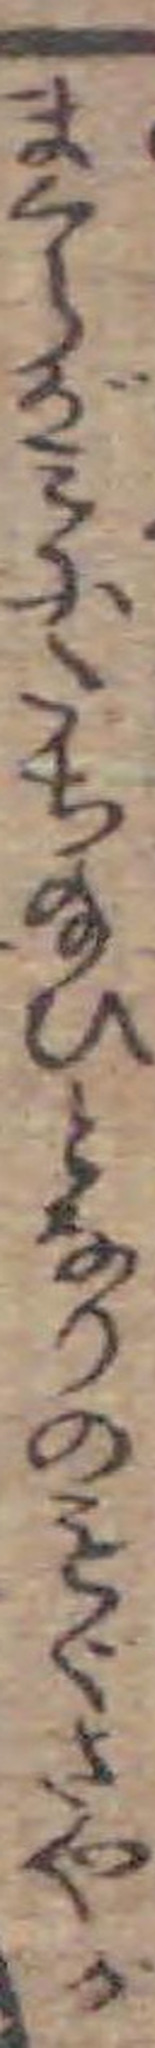まくらがみにたち給ひとなりのもぐさやが
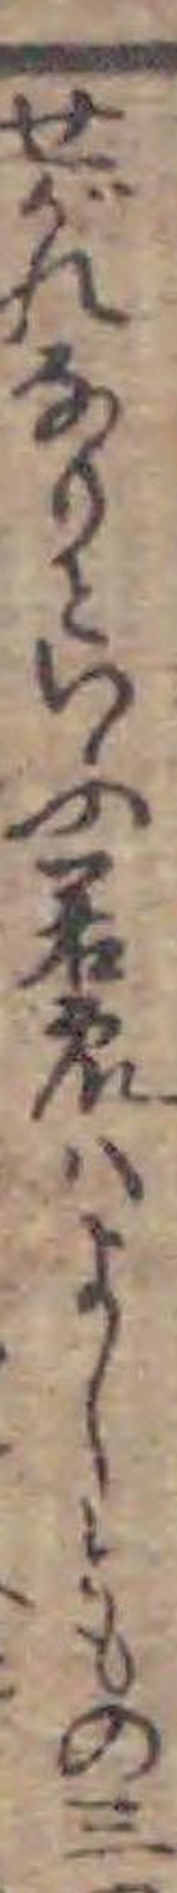せがれなりといふ若衆はよしともの三男
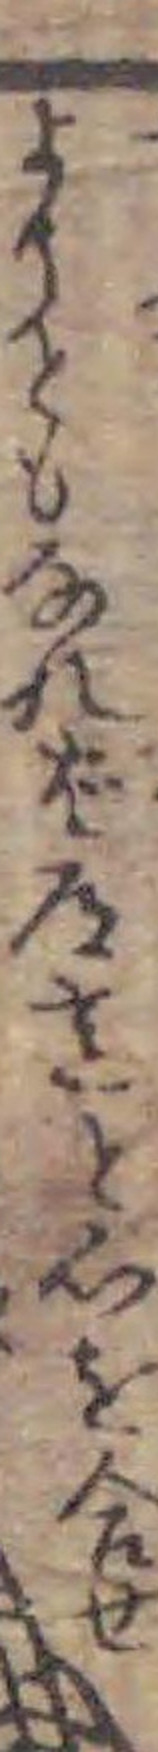よりともなれば道意と心を合せ
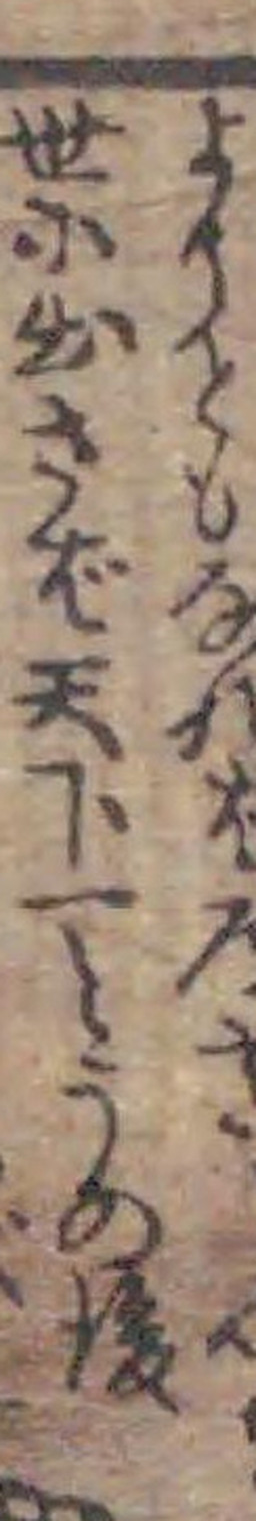世に出さば天下一とうの後
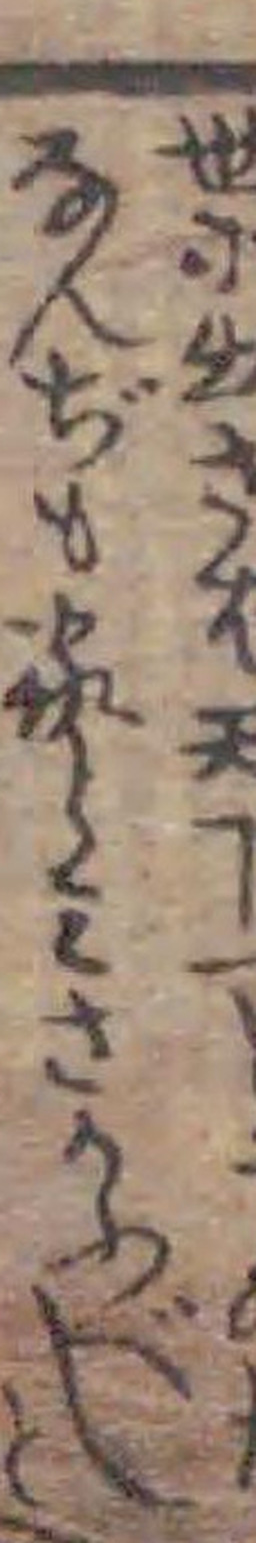なんぢも家とみさかふべしと
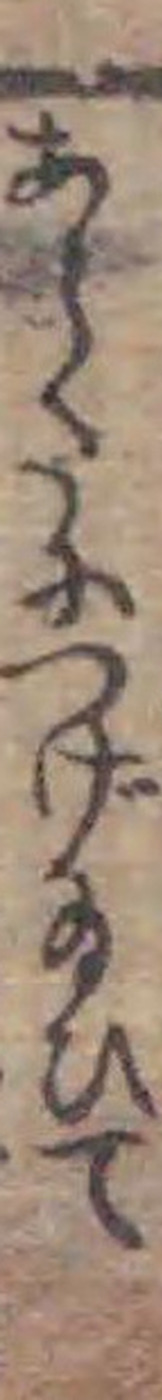あらたにつげ給ひて
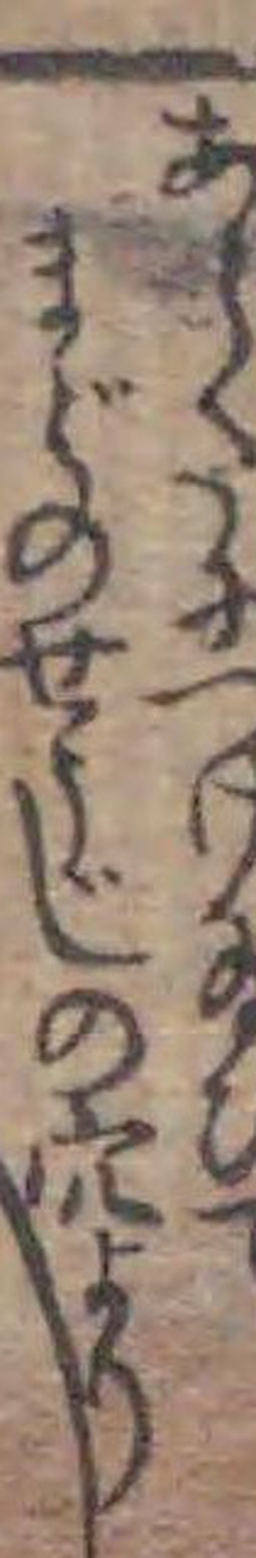まどのせうじの穴より
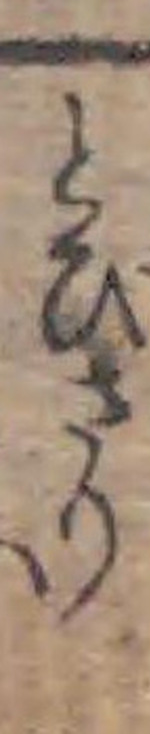とびさり
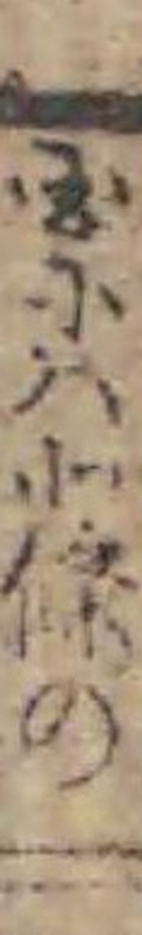国には北条の
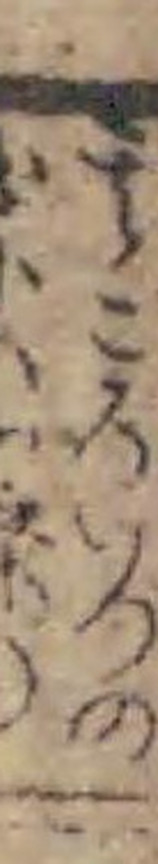其ころいつの
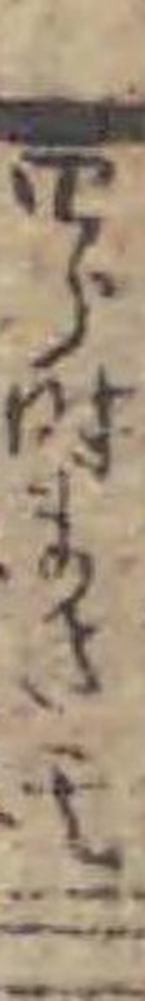四郎時まさ其
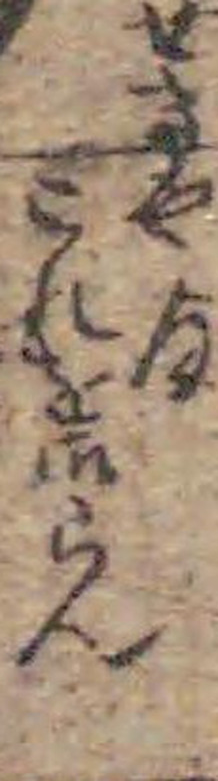これを御らん
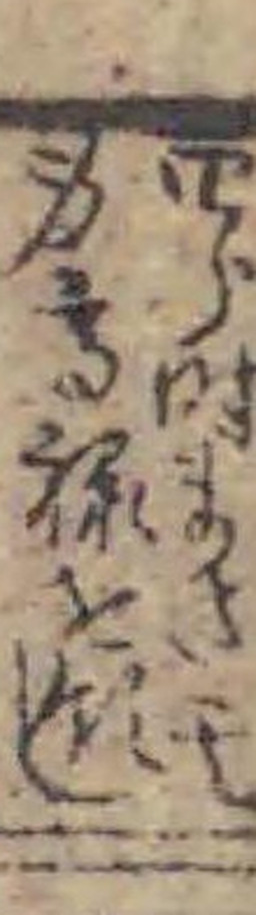身高禄を領し
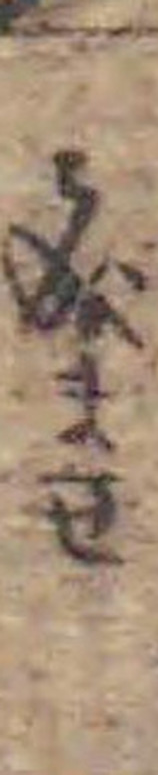被成ませ
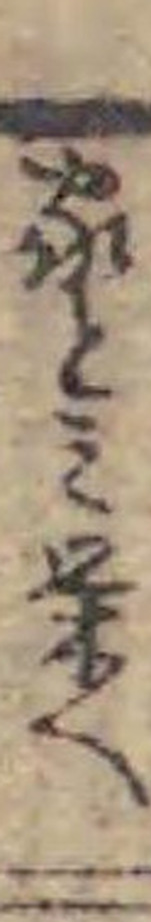家とみ栄へ
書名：三舛増鱗組 : 3巻
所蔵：国立国会図書館 National Diet Library, JAPAN
